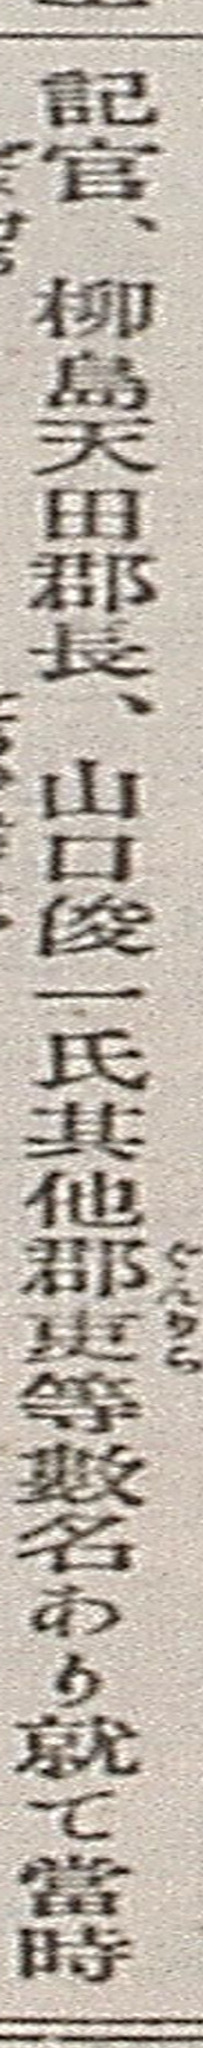記官、柳島天田郡長、山口俊一氏其他郡吏等数名あり就て当時
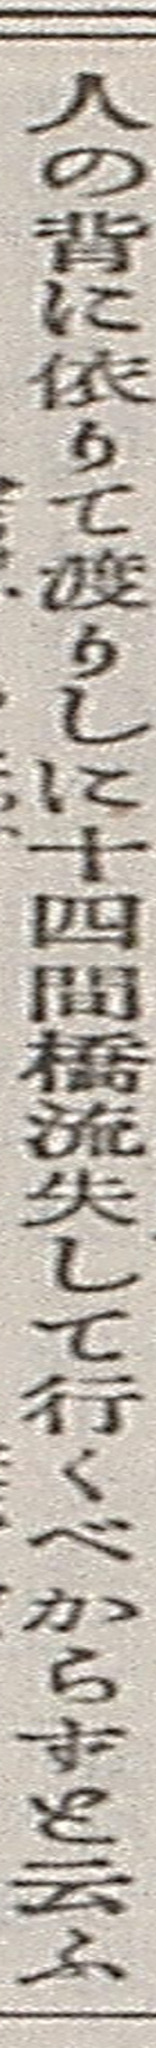人の背に依りて渡りしに十四間橋流失して行くべからずと云ふ
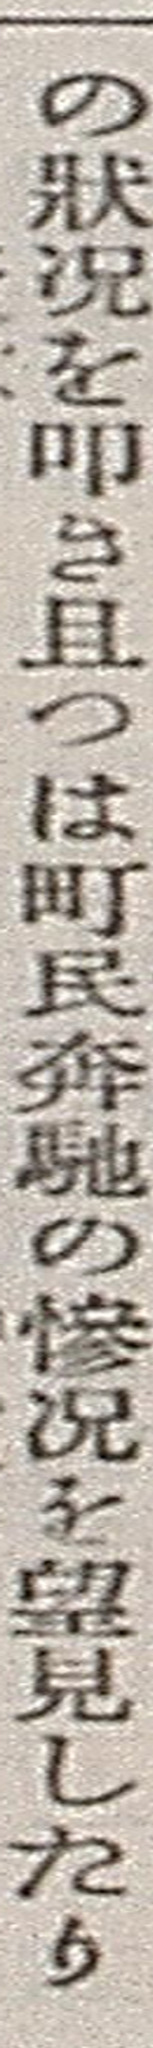の状況を叩き且つは町民奔馳の惨況を望見したり
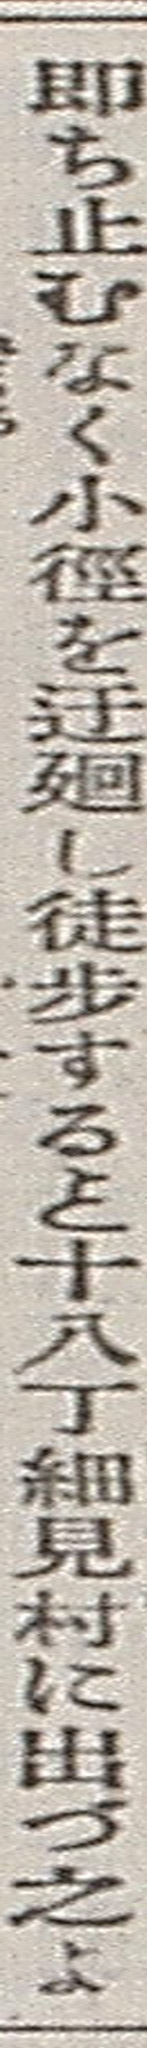即ち止むなく小徑を迂廻し徒歩すると十八丁細見村に出づ之よ
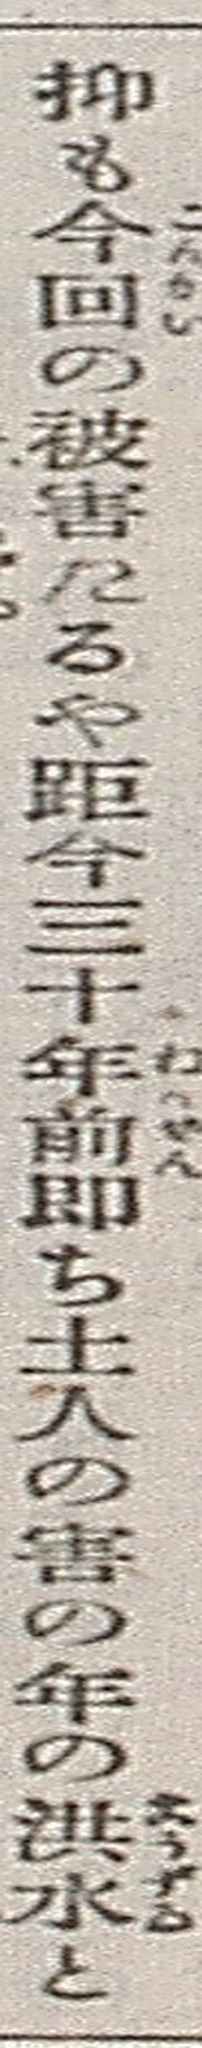抑も今回の被害たるや距今三十年前即ち土入の害の年の洪水と
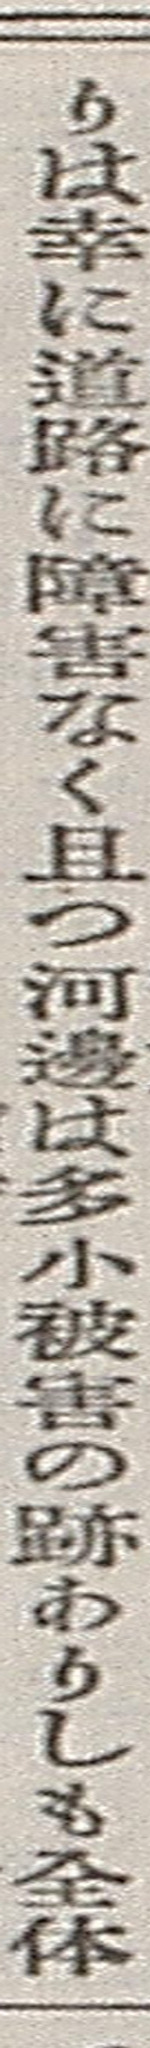りは幸に道路に障害なく且つ河辺は多少被害の跡ありしも全体
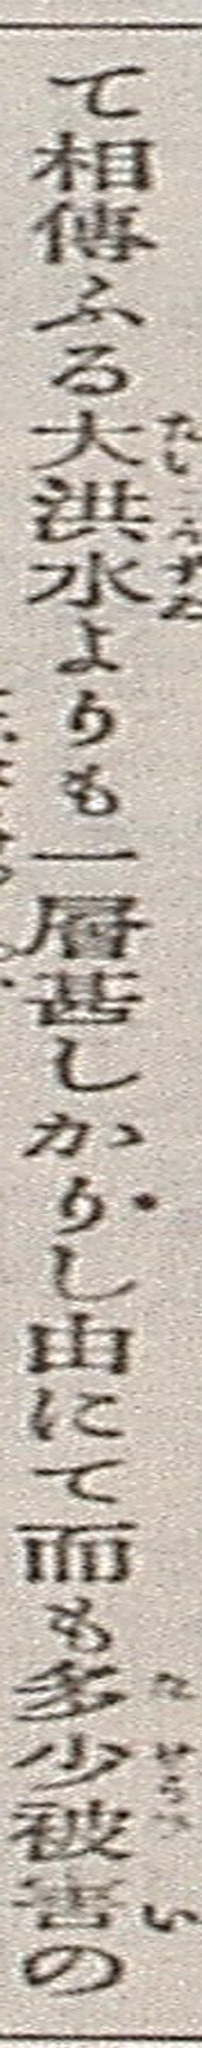て相伝ふる大洪水よりも一層甚しかりし由にて而も多少被害の
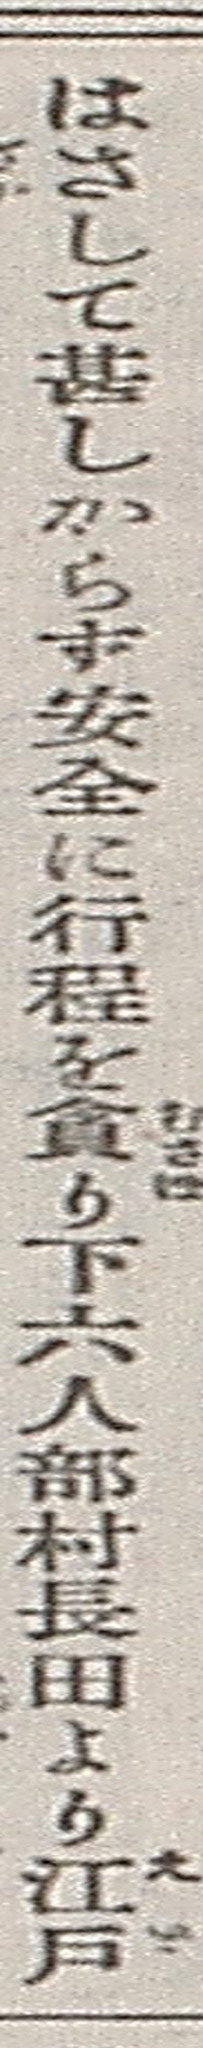はさして甚しからず安全に行程を貪り下六人部村長田より江戸
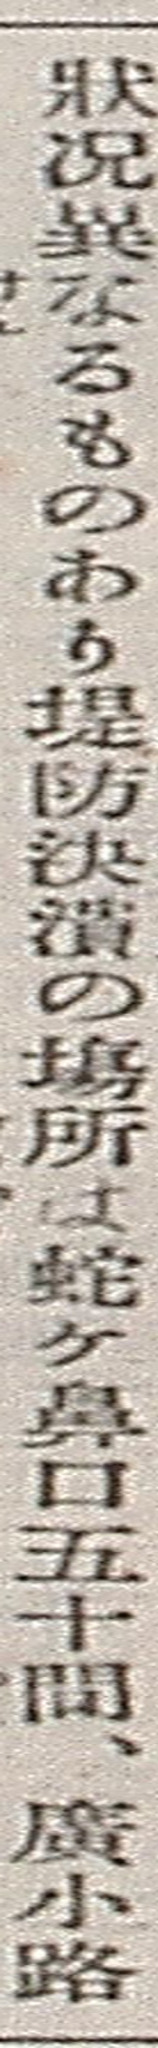状況異なるものあり堤防决潰の場所は蛇ヶ鼻口五十間、広小路
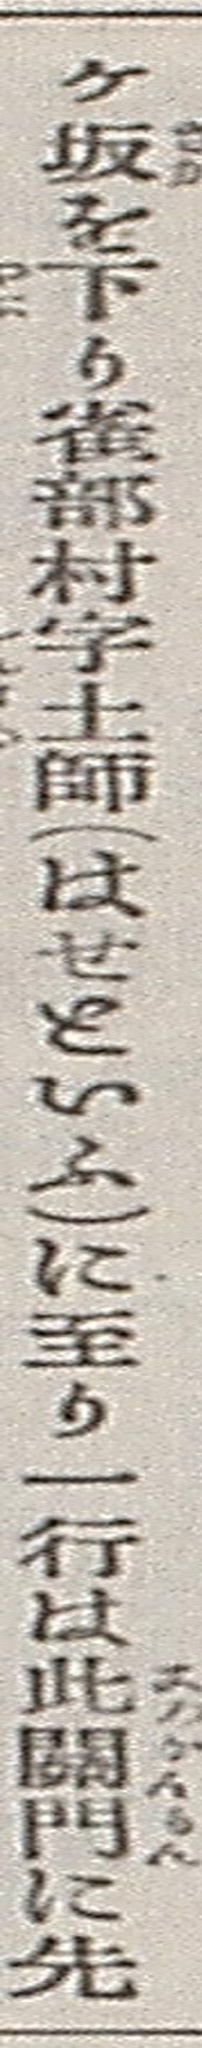ヶ坂を下り雀部村字土師に至り一行は此関門に先
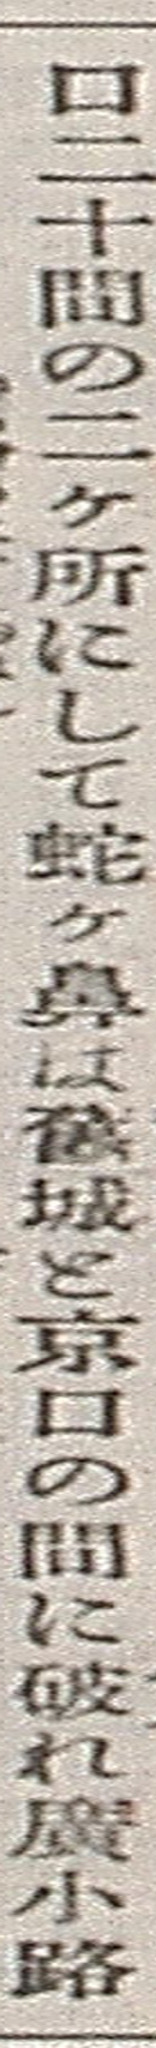口二十間の二ヶ所にして蛇ヶ鼻は旧城と京口の間に破れ広小路
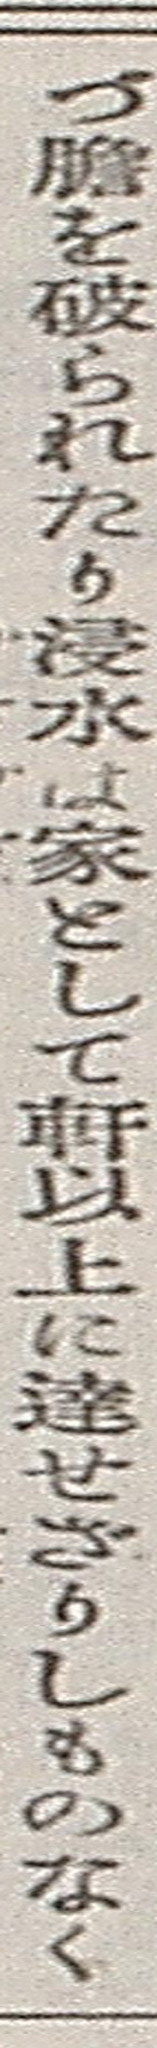づ膽を破られたり浸水は家として軒以上に達せざりしものなく
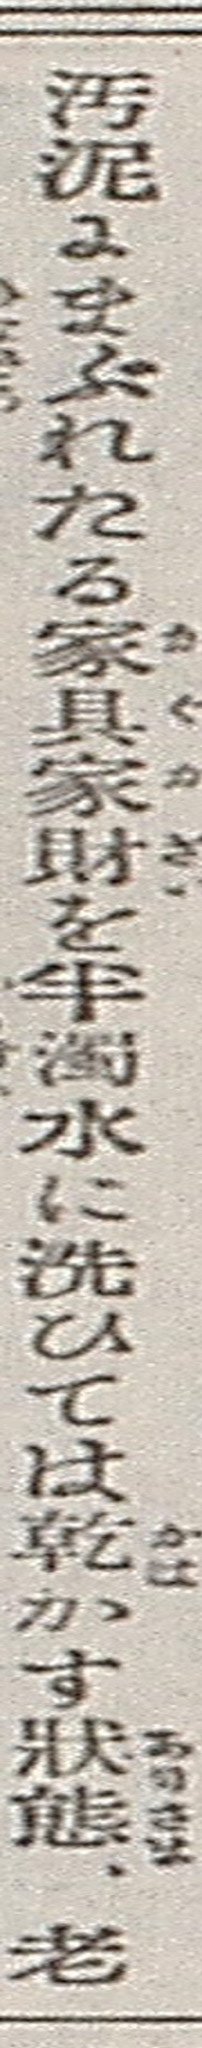汚泥にまぶれたる家具家財を半濁水に洗ひては乾かす状態、老
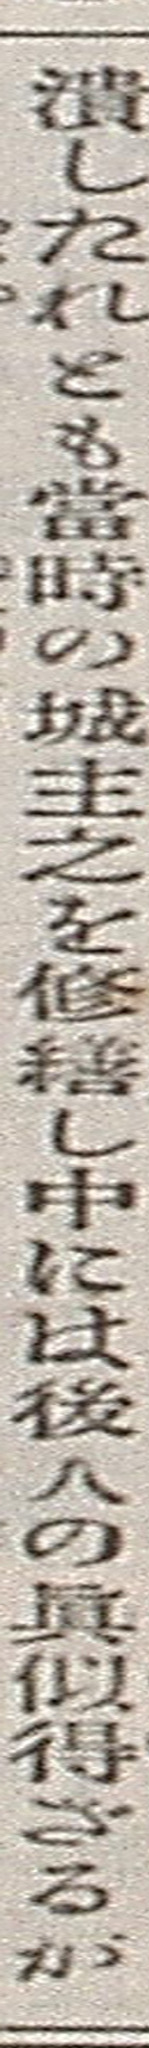潰したれども当時の城主之之を修繕し中には後人の真似得ざるが
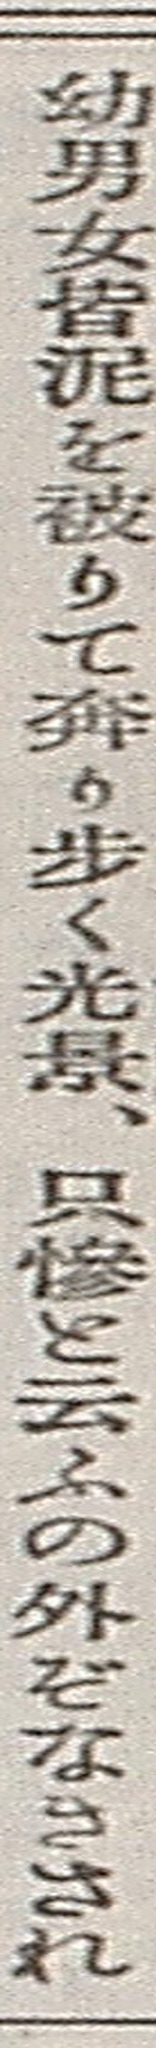幼男女皆泥を被りて奔り歩く光景、只惨と云ふの外ぞなきサレ
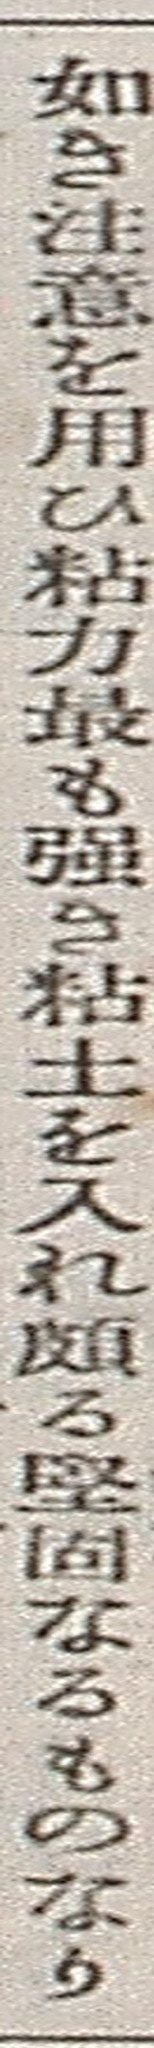如き注意を用ひ粘力最も強き粘土を入れ頗る堅固なるものなり
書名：風俗畫報臨時増刊第百二十六號　洪水被害録（中）
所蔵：東京大学地震研究所図書室 Earthquake Research Institute Library, The University of Tokyo, JAPAN
